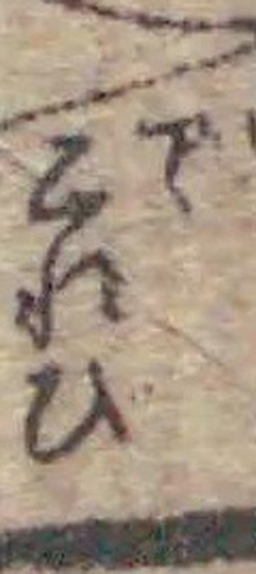これび
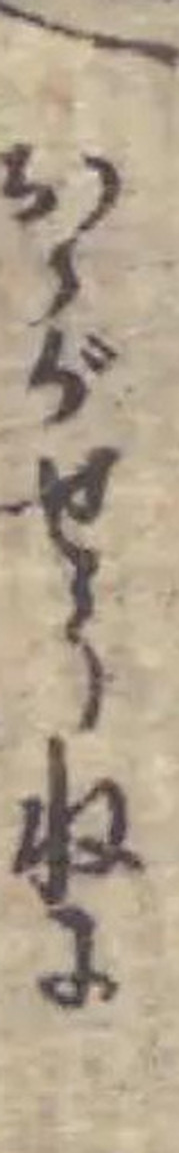おらがせうねに
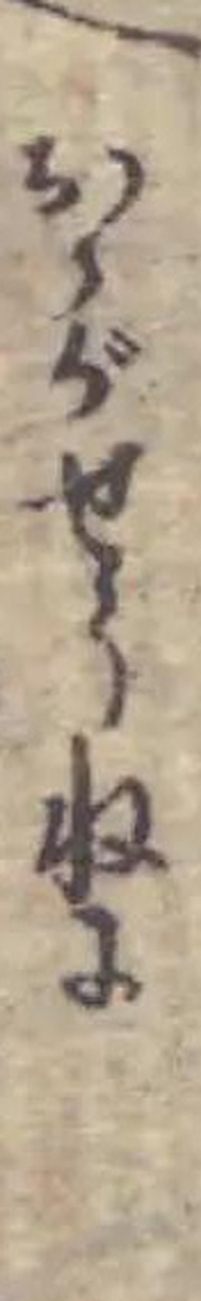おらがせうねに
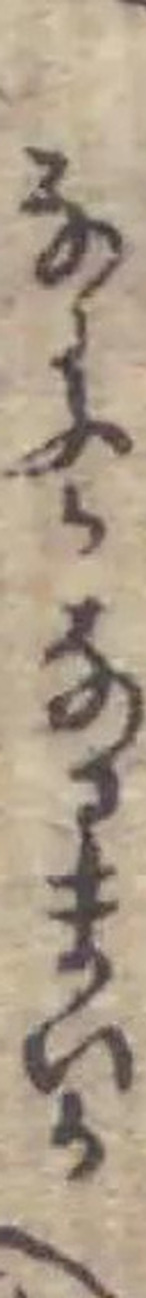ならふかなるまいか
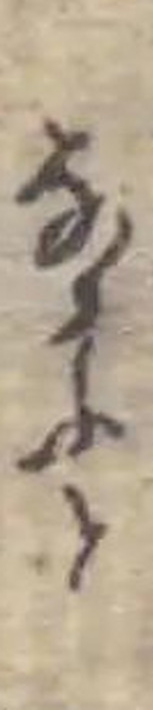ならふと
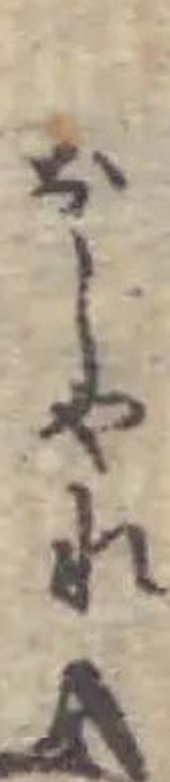おしやれ

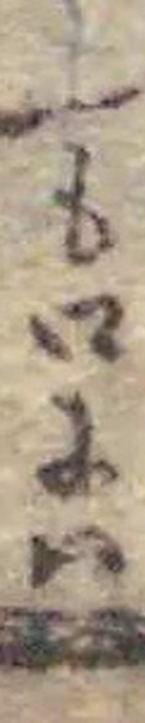も口には
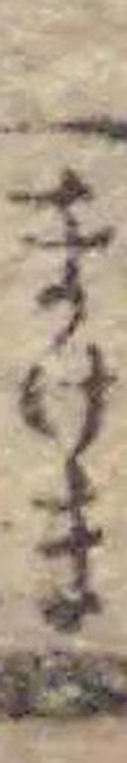まけま
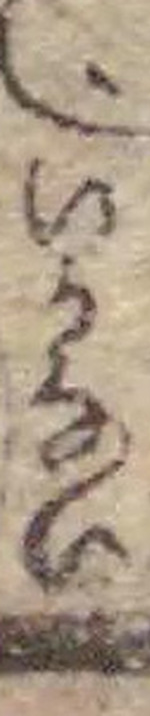いかない
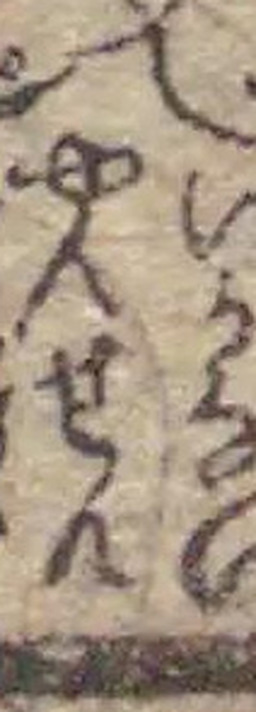やんせん
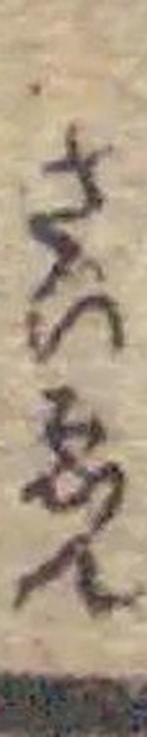さいゑん
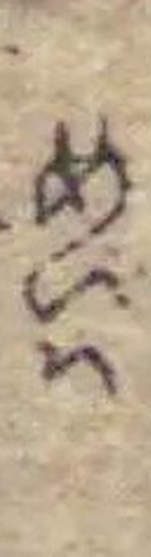めいは
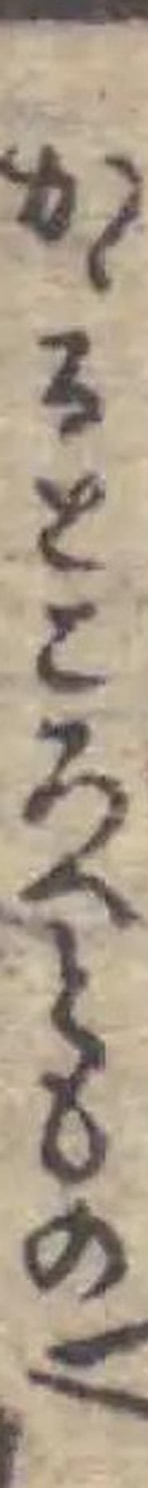かゝるところへともの
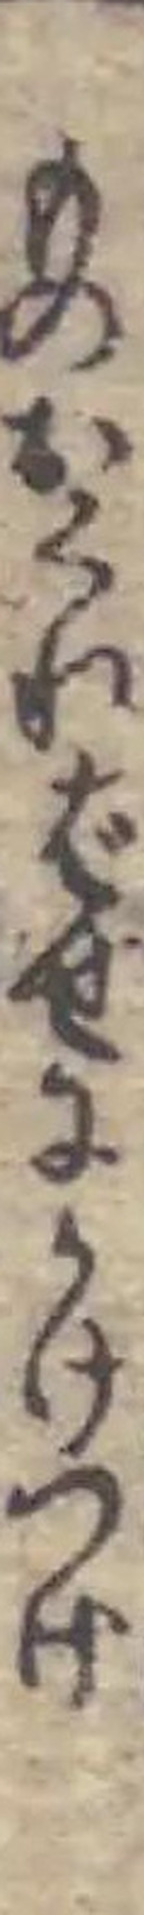ものおくればせにかけつけ
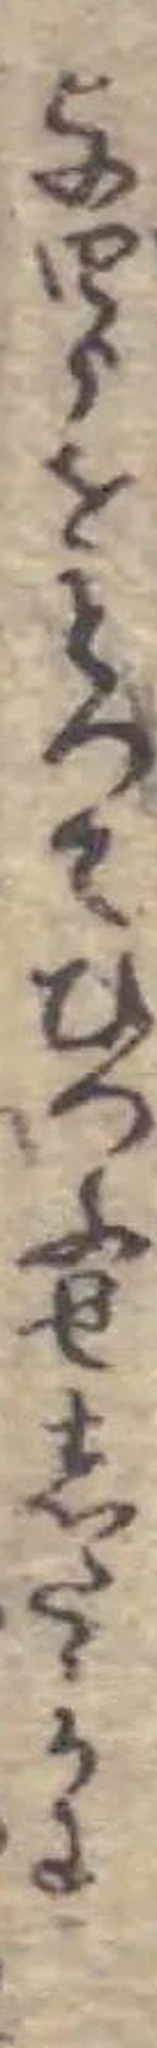与四郞をとつてひつふせしたゝかに
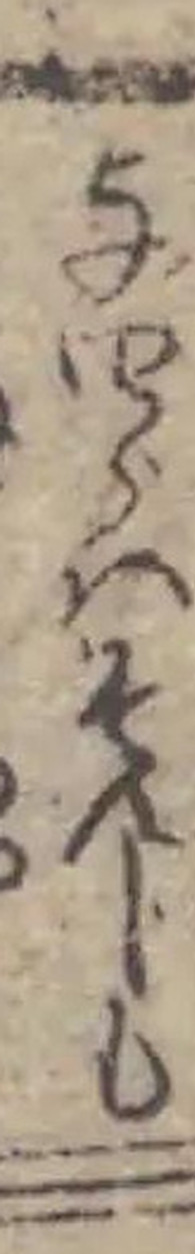与四郞はそんじも
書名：色男其処此処 3巻
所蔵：国立国会図書館 National Diet Library, JAPAN
